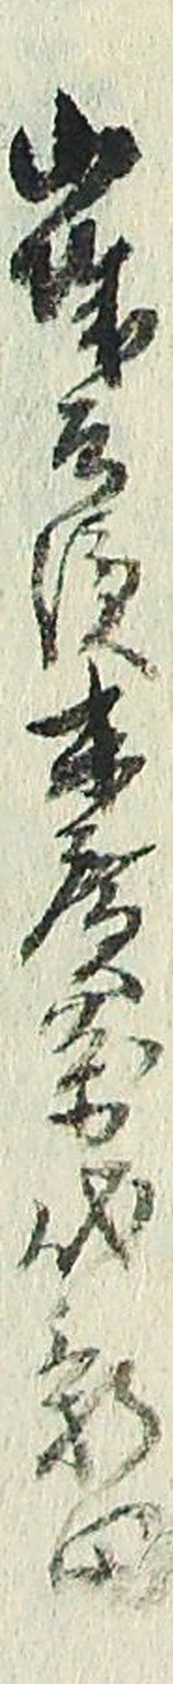山城屋浜末広万代新田

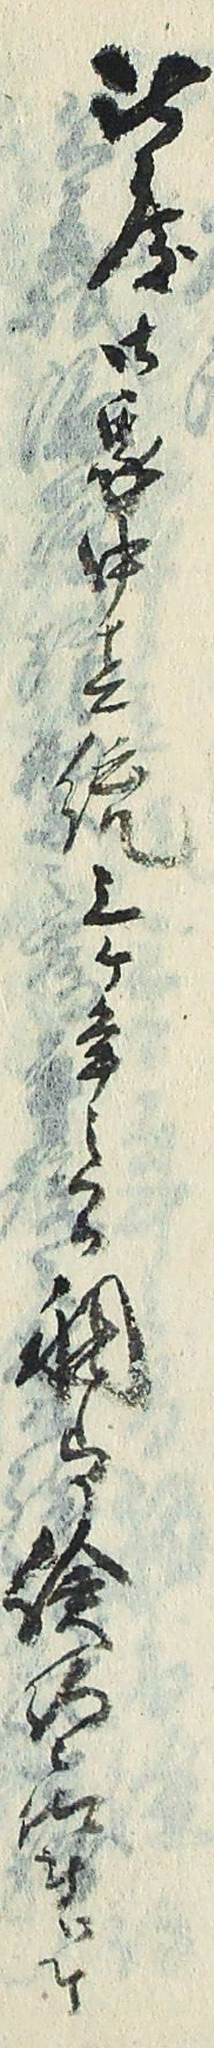此度御家中壱統三ケ年之間稠布倹約被仰付候に付
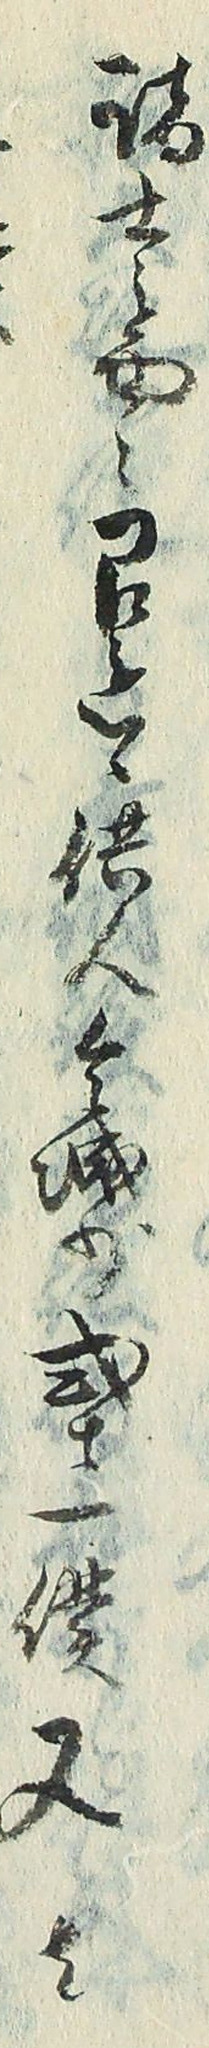諸士之面々召連候供人令減少或は一僕又は
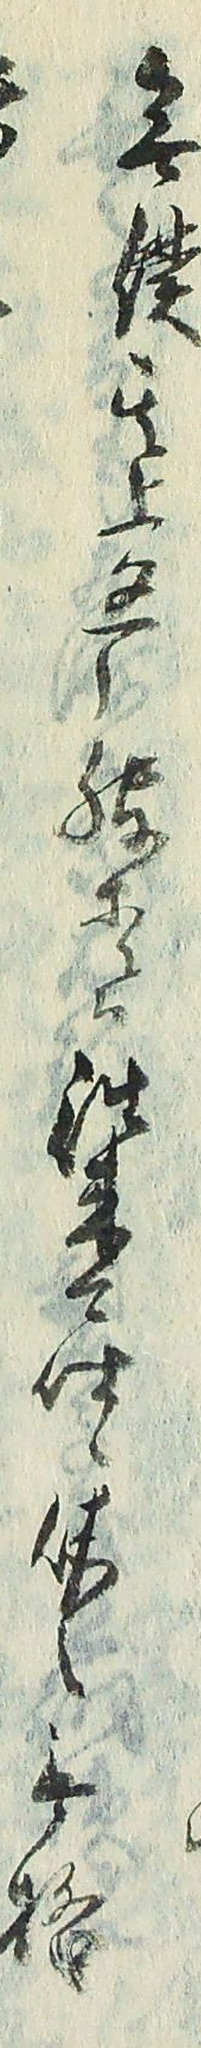無僕其上麁服等に而往来可仕候依之無格
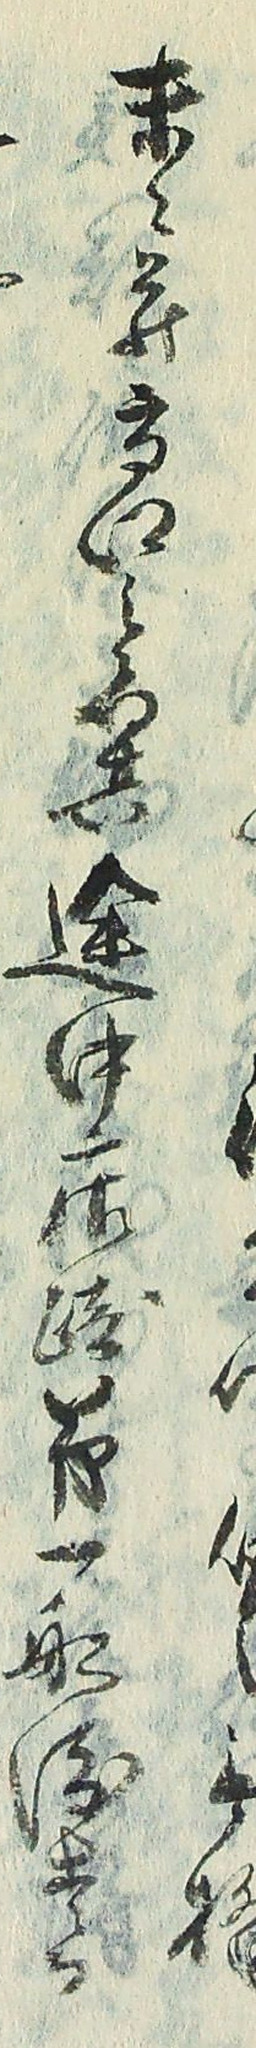末々幷市郷之者共途中店崎第一船渡等に而
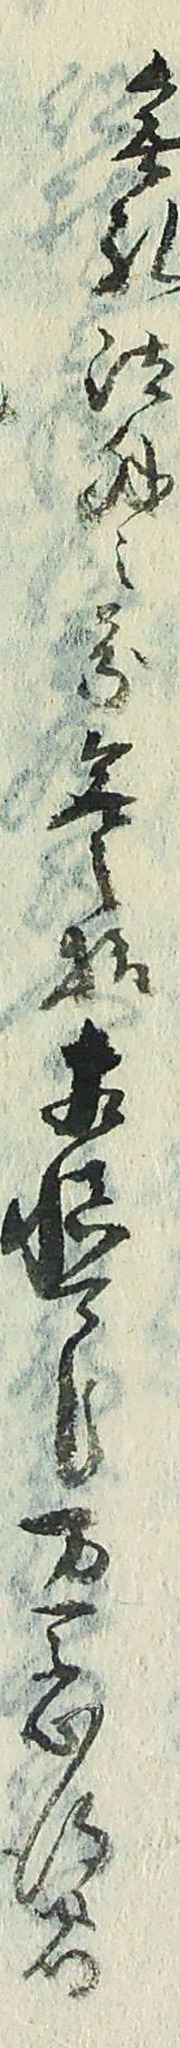無礼法外之義無之様相慎可申候万一不心得之者
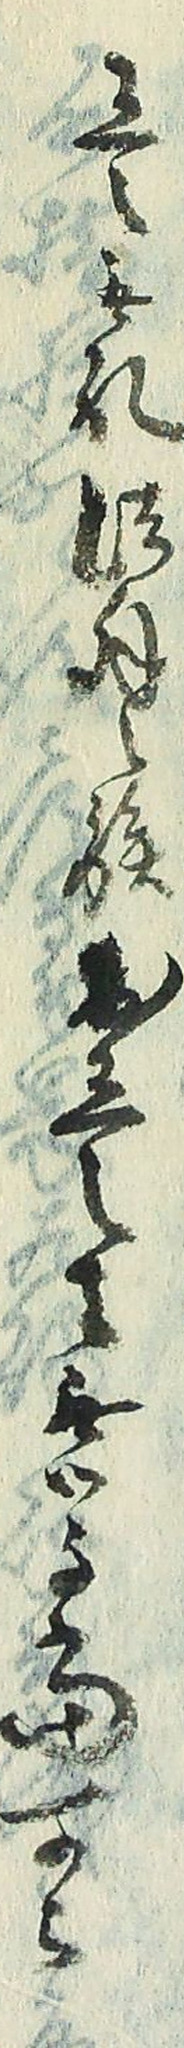有之無礼法外之族於有之は無御手当可被
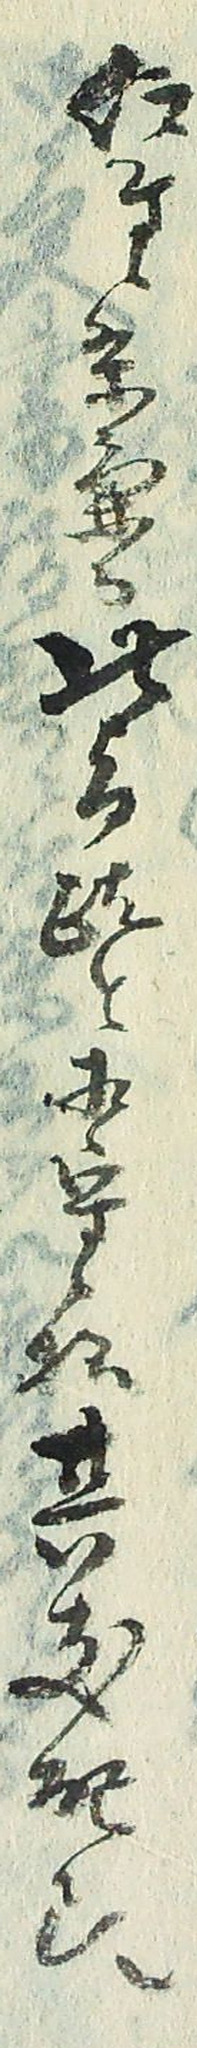仰付候条兼而此旨屹と相守候様其支配頭
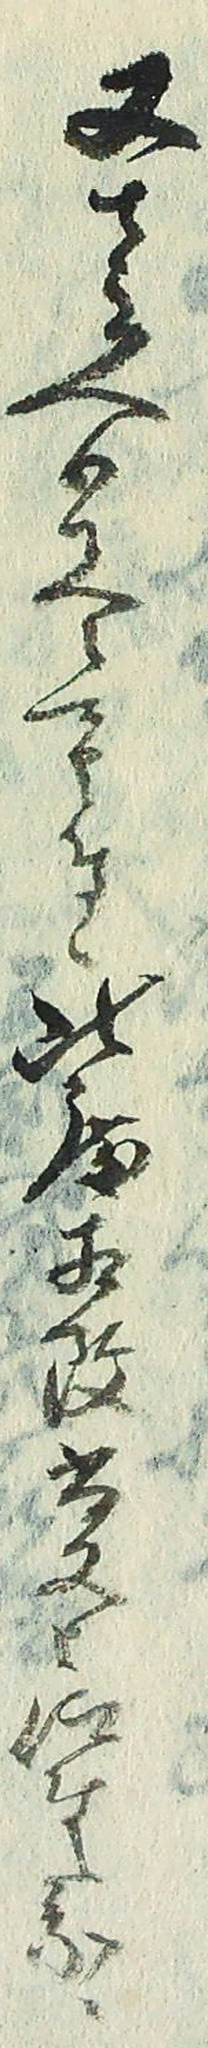又は主人ゟ夫々可申付候此度相改尚又被仰付候義に
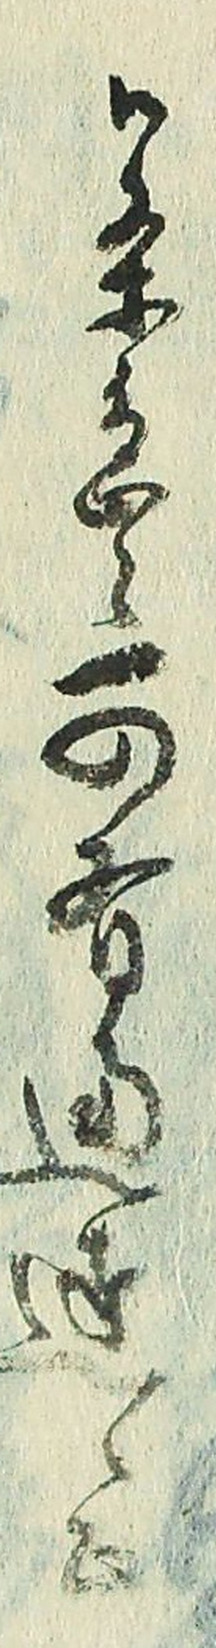候条急々可有通達候以上
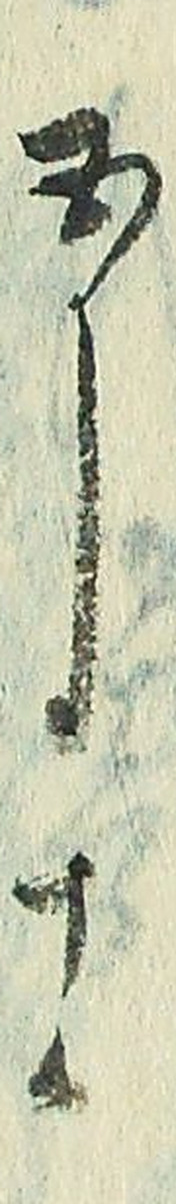五月十日
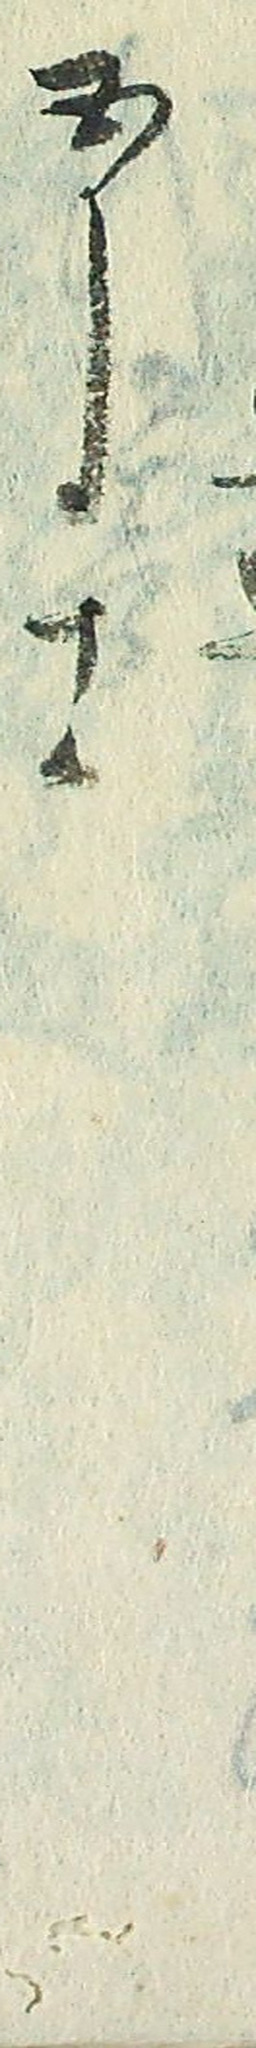五月十日

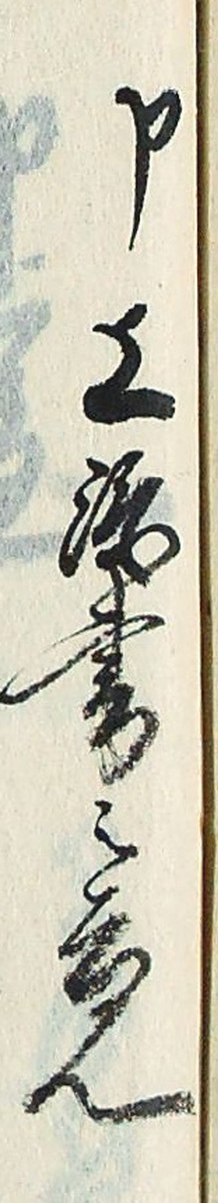申上添書之覚
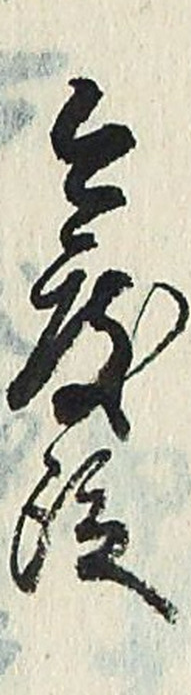今度従
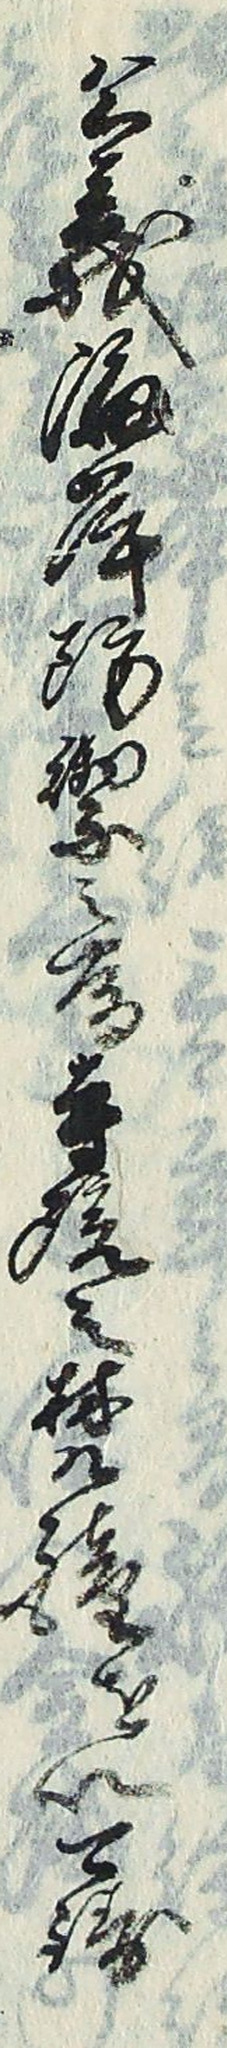公義海岸防禦之為寺院之梵鐘を以可鋳
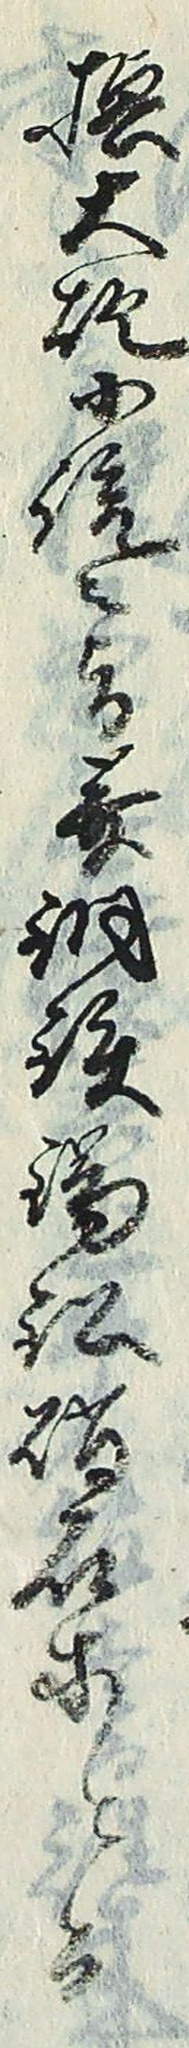換大砲小銃之旨幷銅鉄錫鉛硝石等に而
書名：諸御用御□受書控
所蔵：鳴門教育大学 Naruto University of Education
